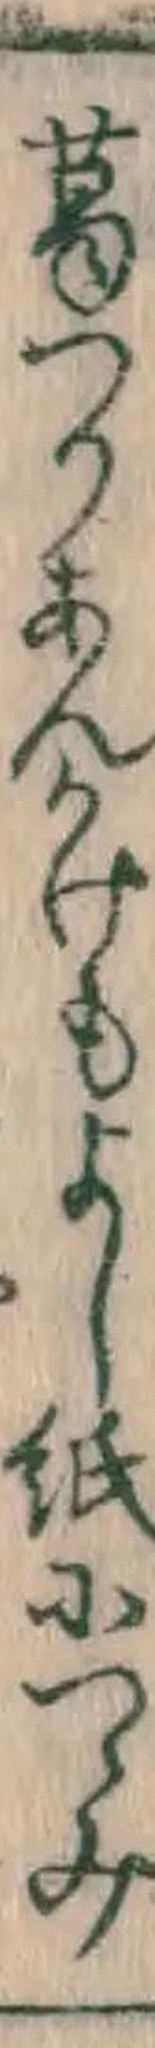葛つりあんかけもよし紙につゝみ
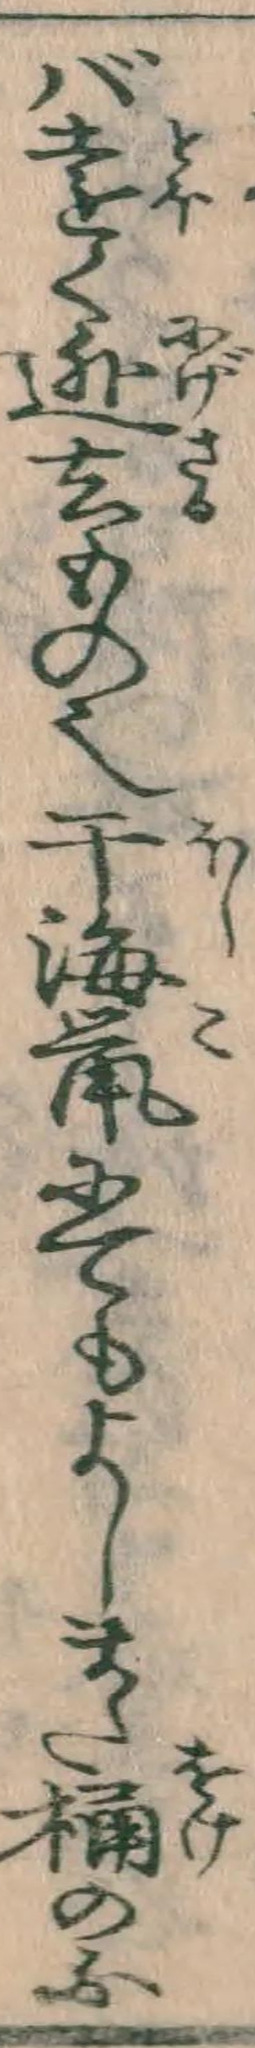ば遠く逃去もの也干海鼠にてもよしまた桶のふ
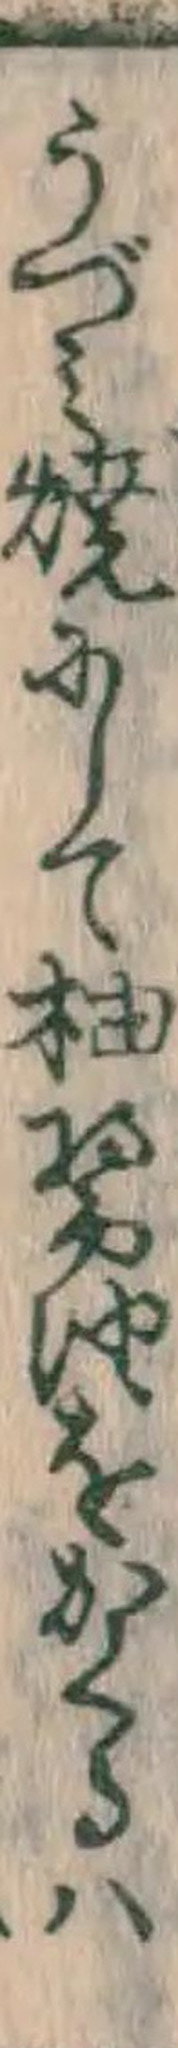うづみ焼にして柚醬油をかくるは
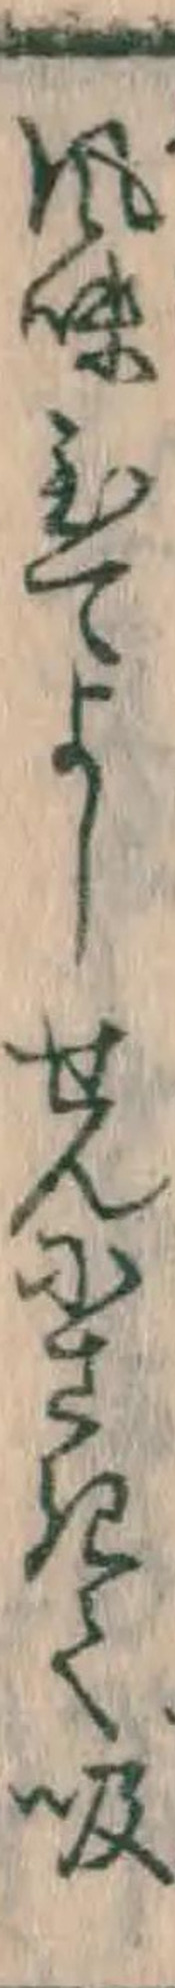風味至てよしせんにさきて吸
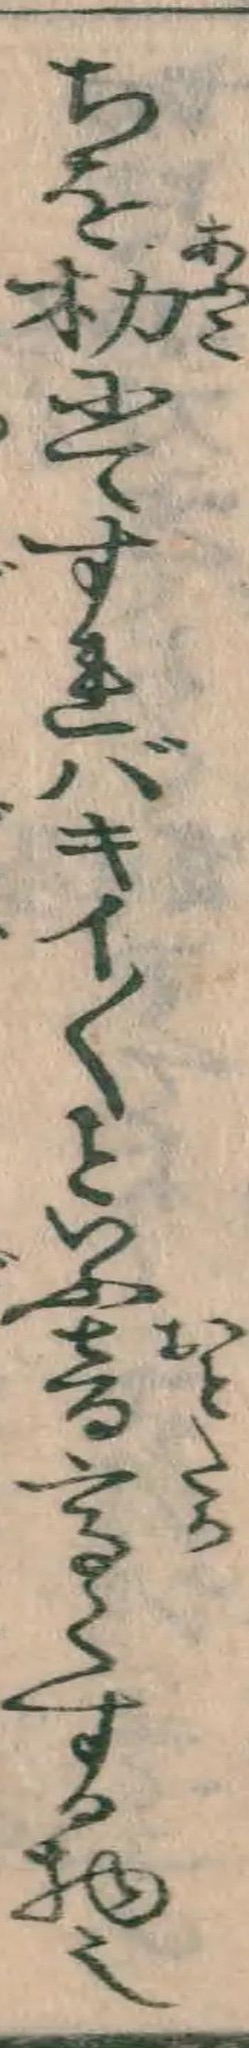ちを朸にてすればキイ〳〵といふ音高くする物也
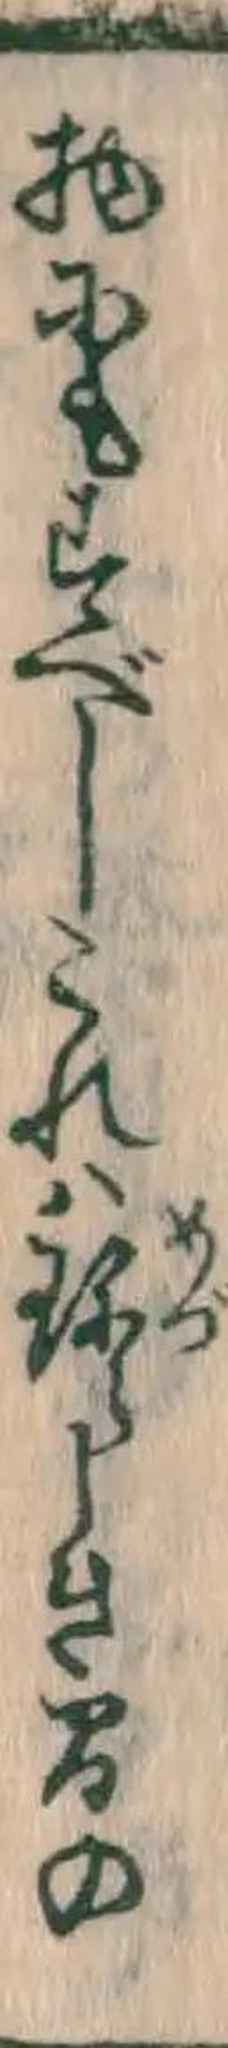物にもすべしこれは珍らしき間の
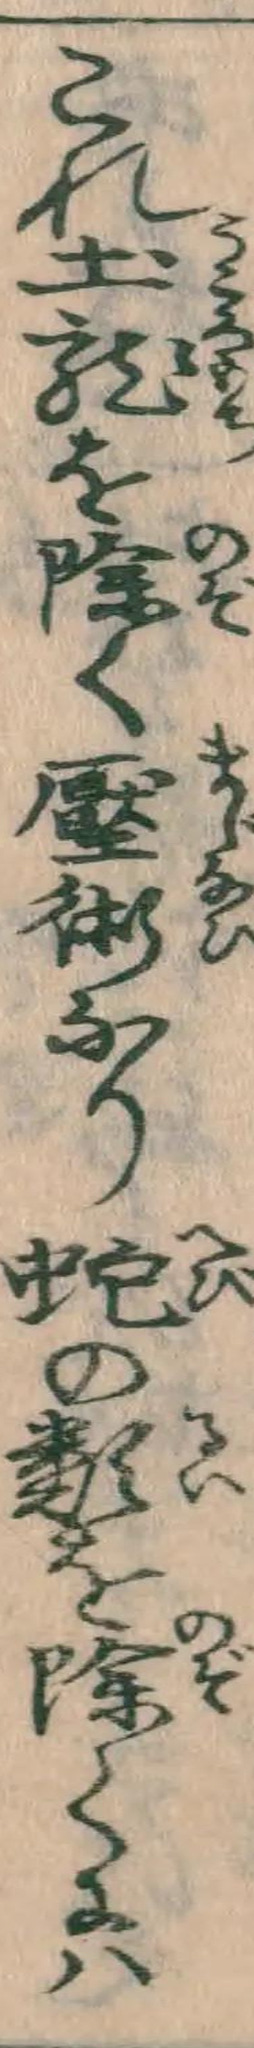これ土龍を除く壓術なり蛇の類を除くには
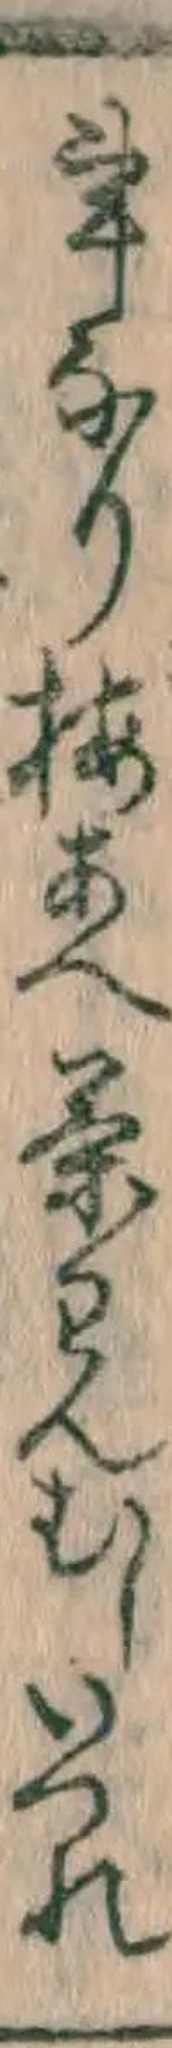事なり梅あへ茶わんむしいつれ
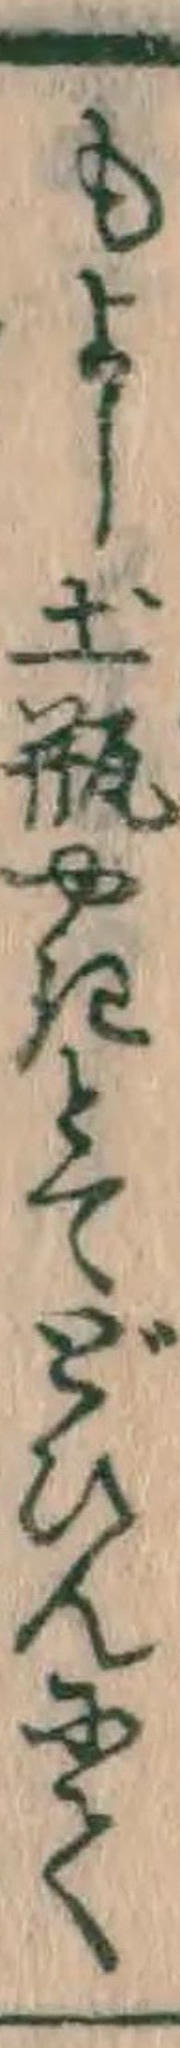もよし土瓶やきとてどひんにて
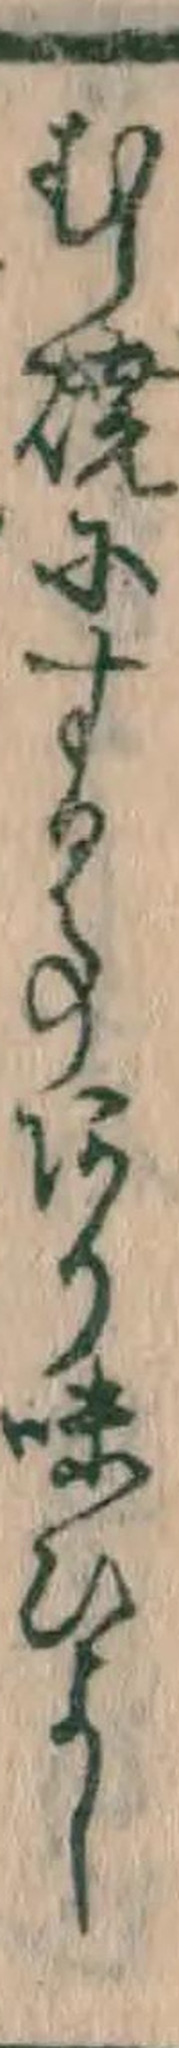むし焼にする事あり味ひよし
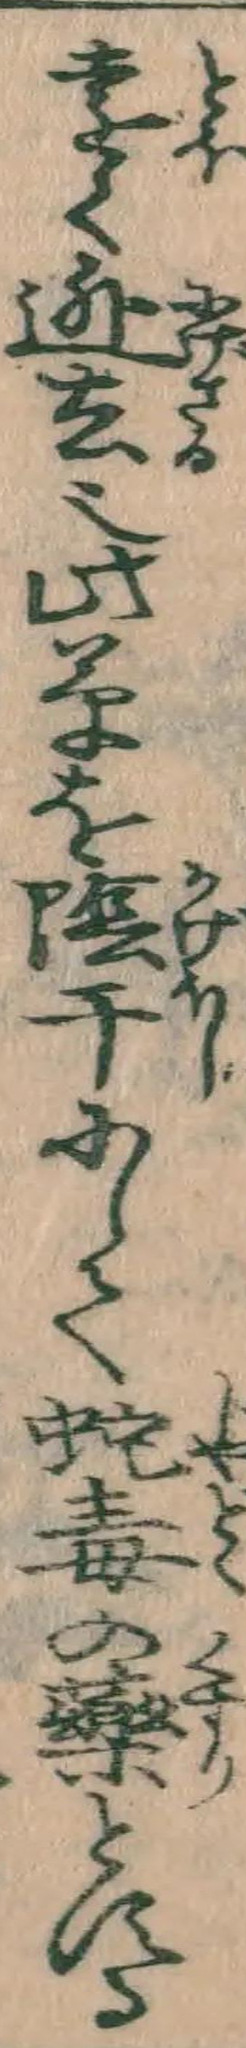遠く逃去也此草を陰干にして蛇毒の薬とする
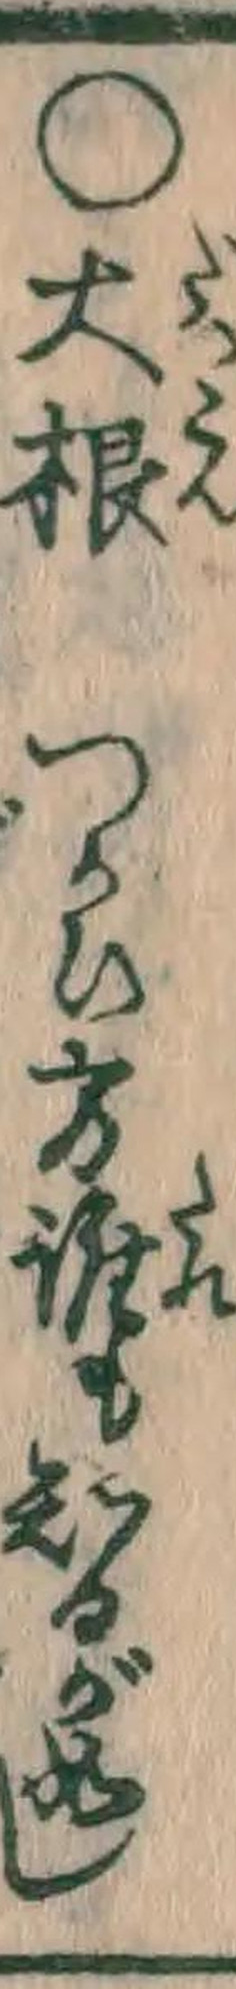○大根つかひ方誰も知るが如し
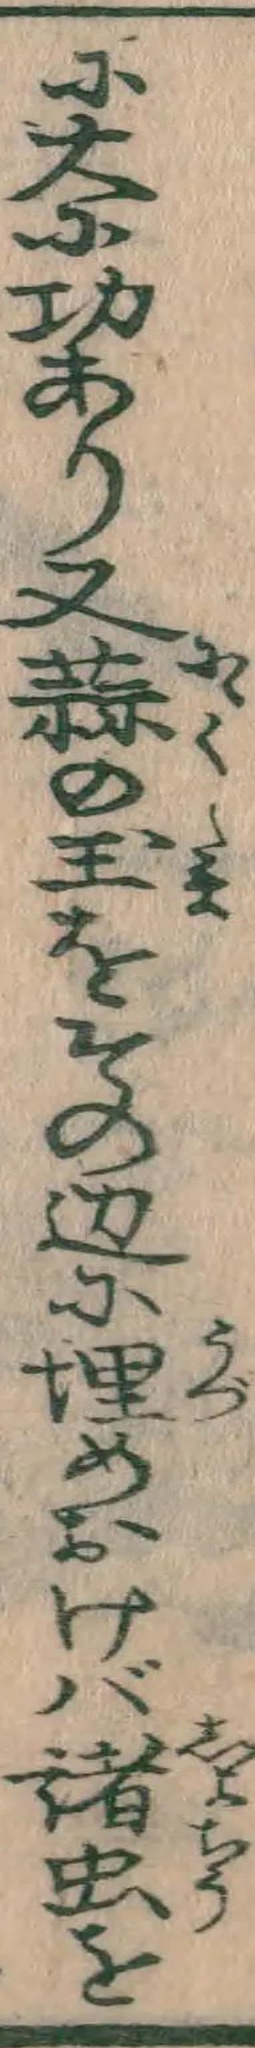に大に功あり又蒜の玉をその辺に埋めおけば諸虫を
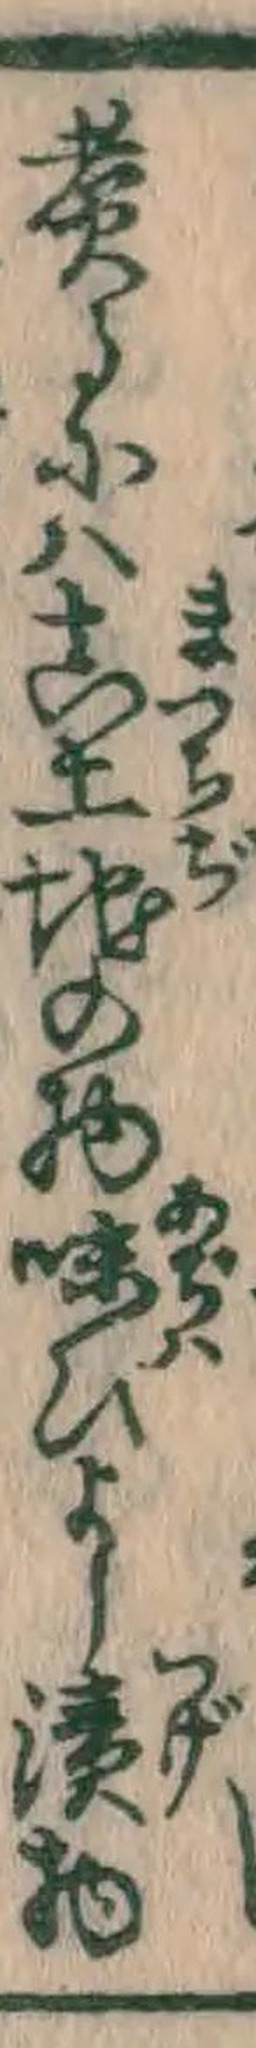煮るには真土地の物味ひよし漬物
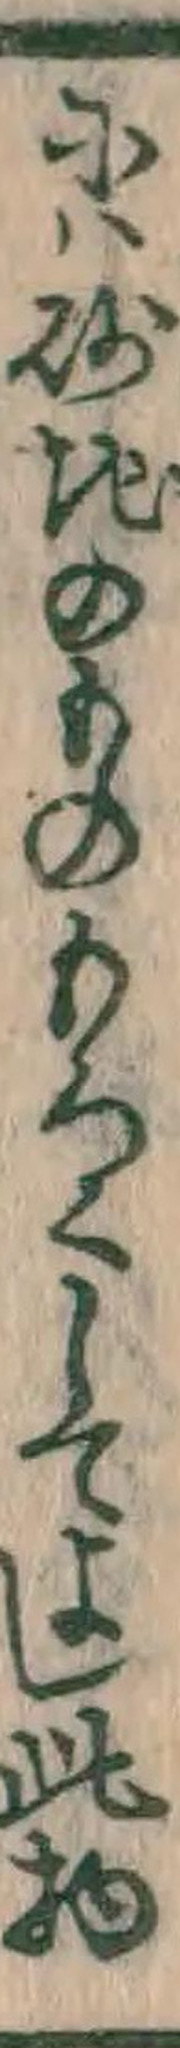には砂地のものもつくしてよし此物
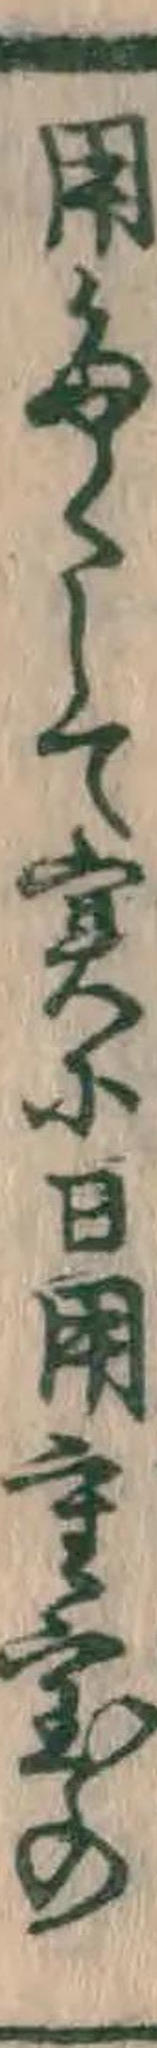用多くして実に日用重宝の
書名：広益秘事大全 3巻. [5]
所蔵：国立国会図書館 National Diet Library, JAPAN
